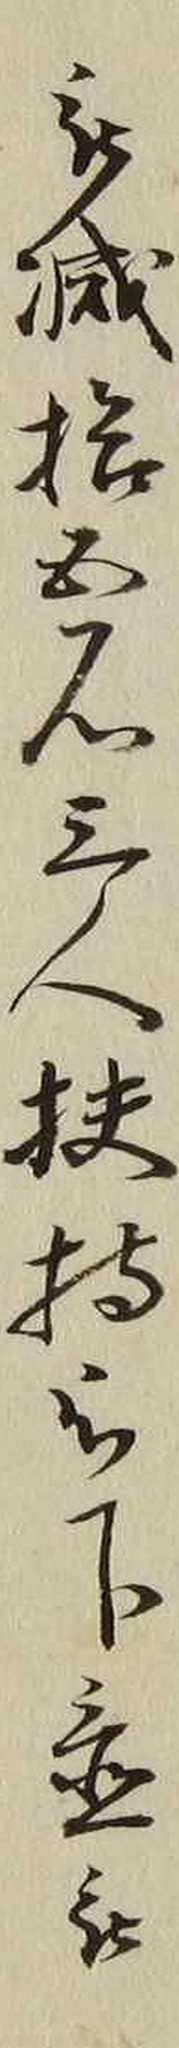被減拾五石三人扶持被下置被
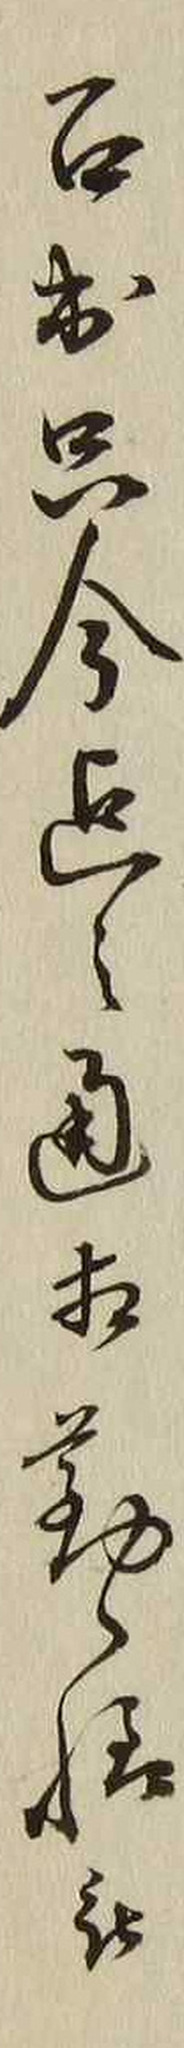召出只今迄之通相勤候様被
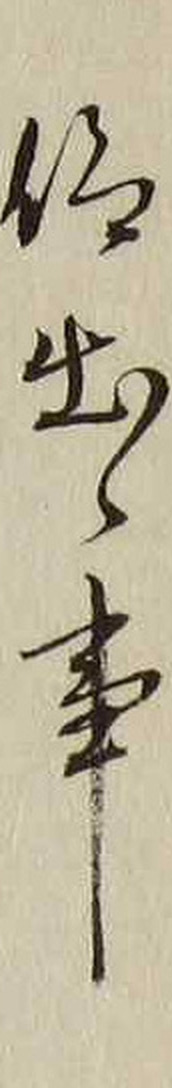仰出候事
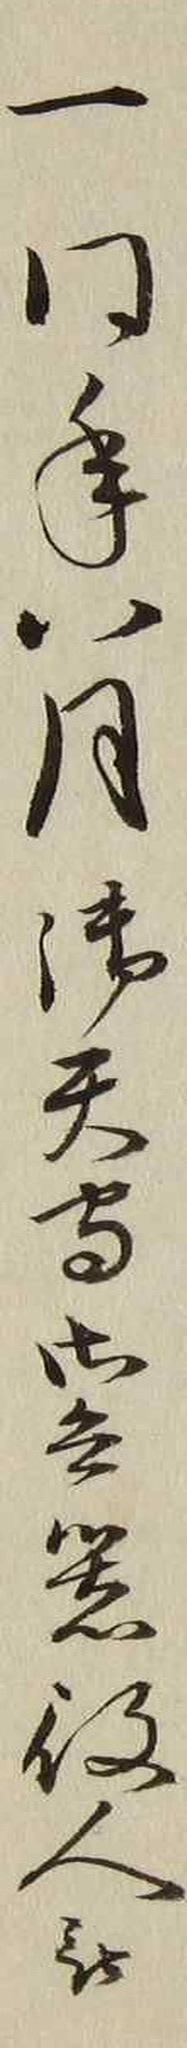一同年八月御天守御兵器役人被
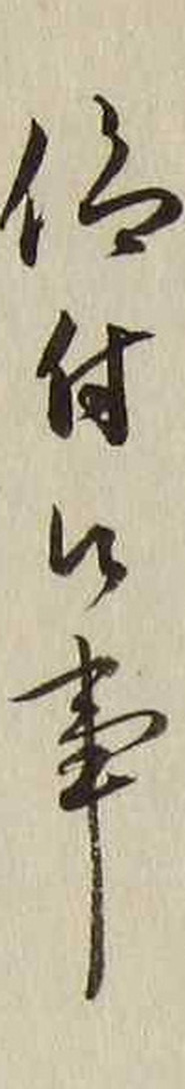仰付候事
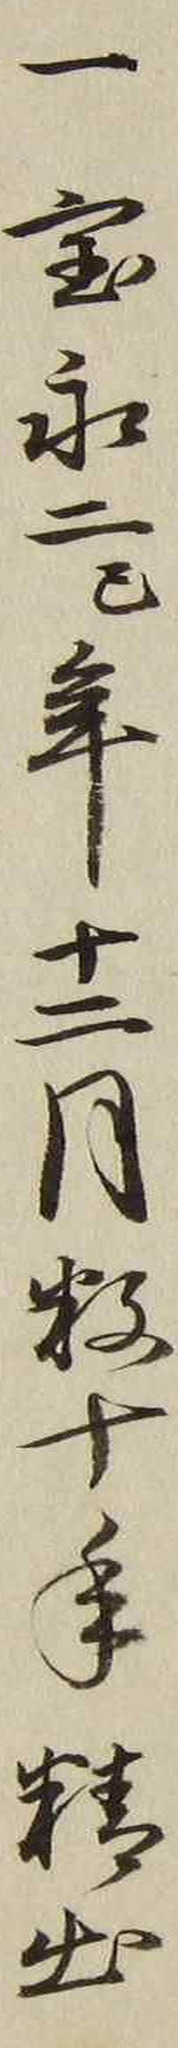一宝永二巳年十二月数十年精出
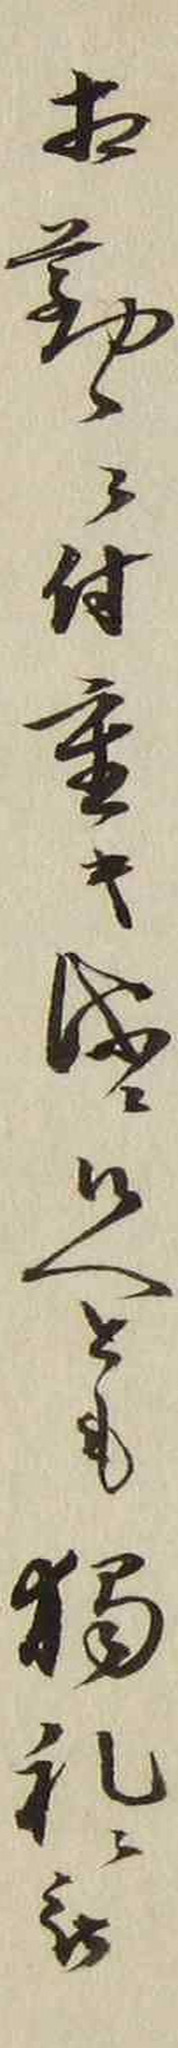相勤候付重キ儀候へとも独礼被
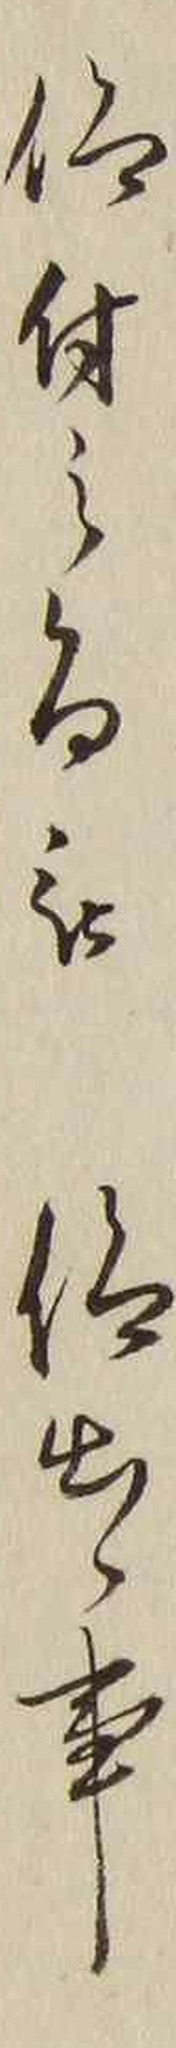仰付之旨被仰出候事

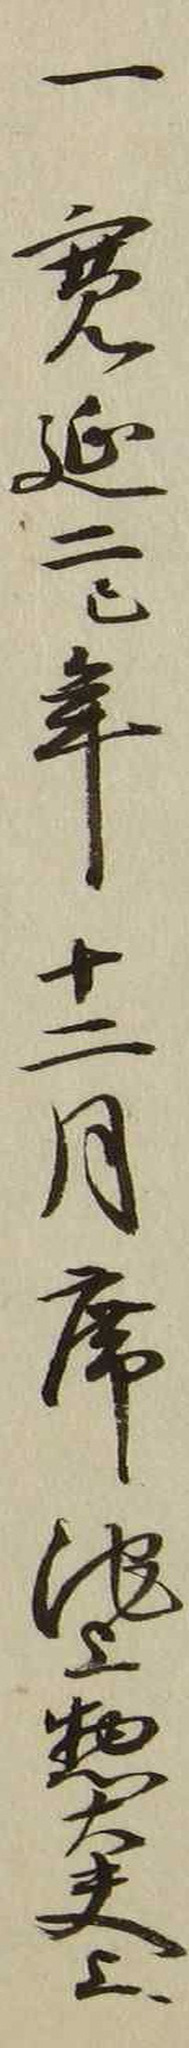一寛延二巳年十二月席池上惣大夫上
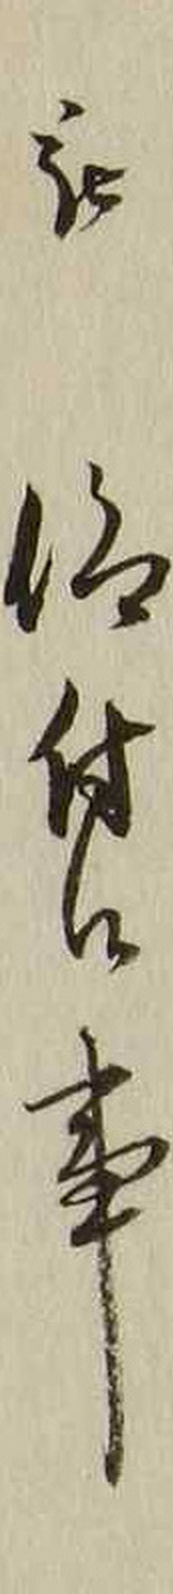被仰付候事
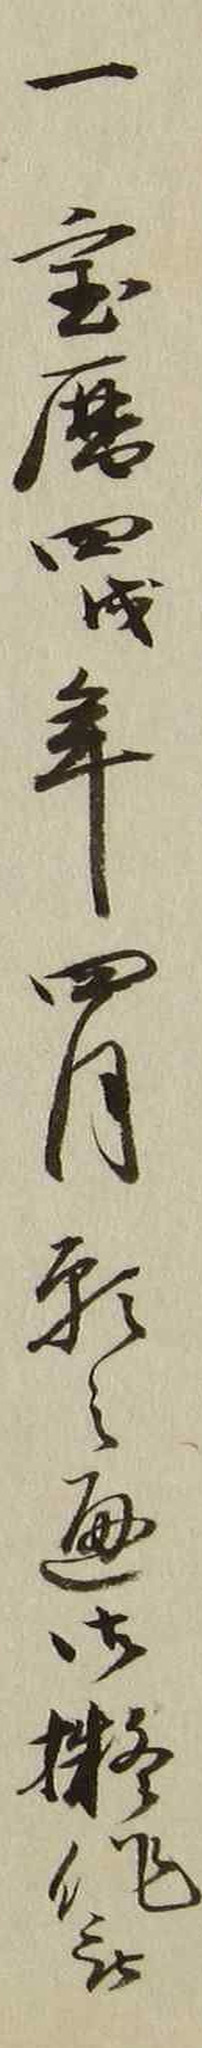一宝暦四戌年四月願之通御擬作被
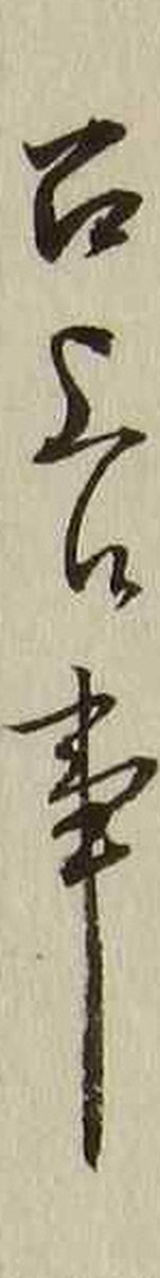召上候事
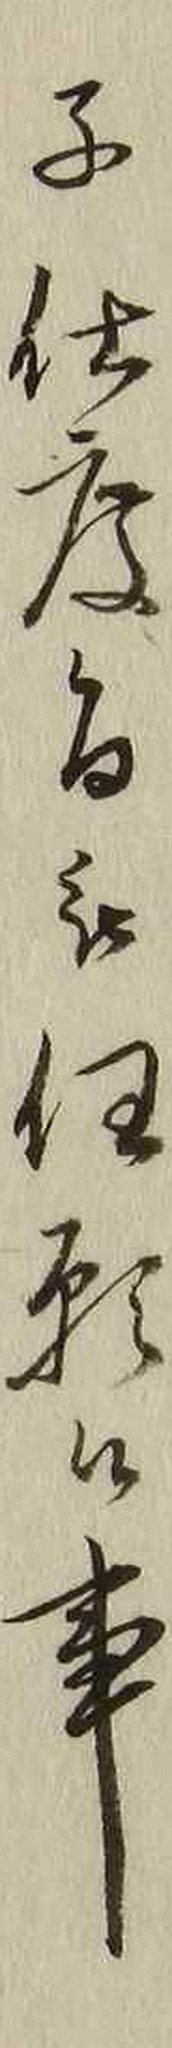子仕度旨被任願候事
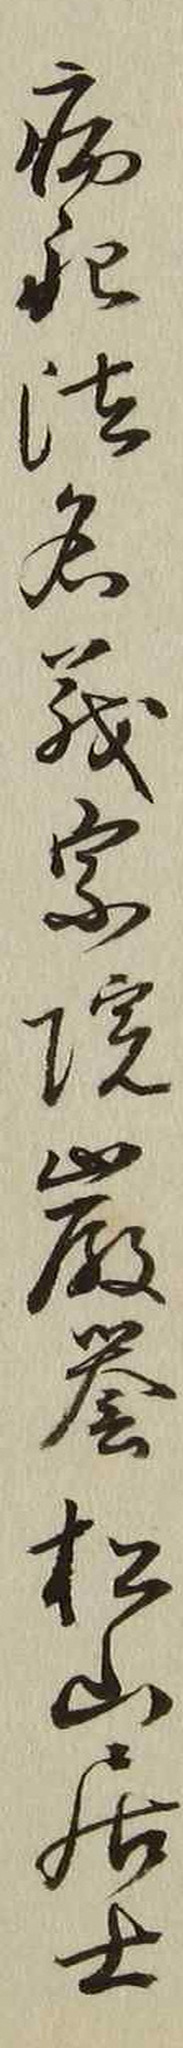病死法名義宗院厳誉松山居士
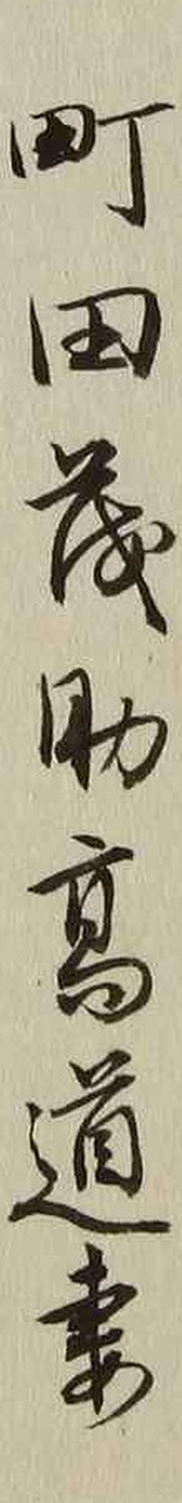女町田茂助高道妻
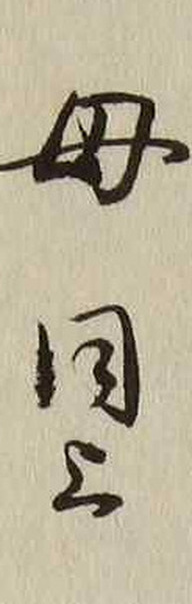母同上
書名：諸士系譜　巻之102　か之部10
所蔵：会津若松市立会津図書館
